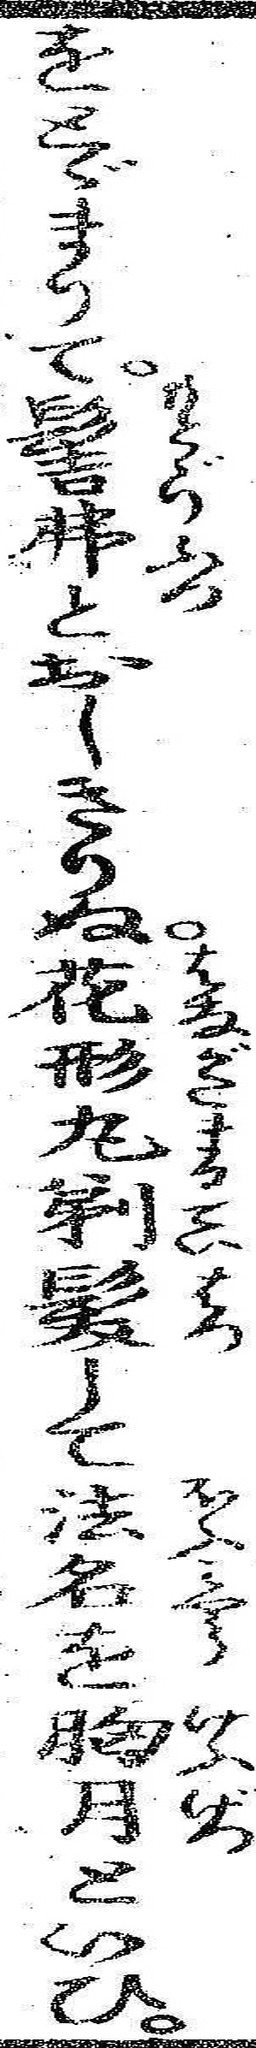をとゞまりて。髻弗とおしきりぬ。花形丸剃髪して法名を胸月といひ。
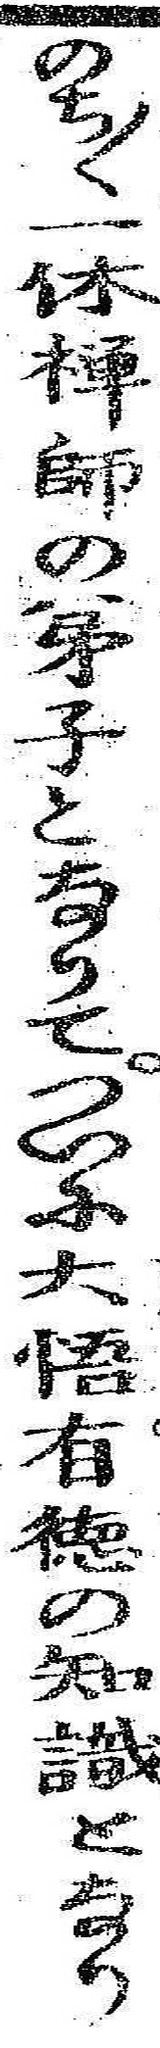のち〳〵一休禅師の弟子となりて。ついに大悟有徳の知識となり
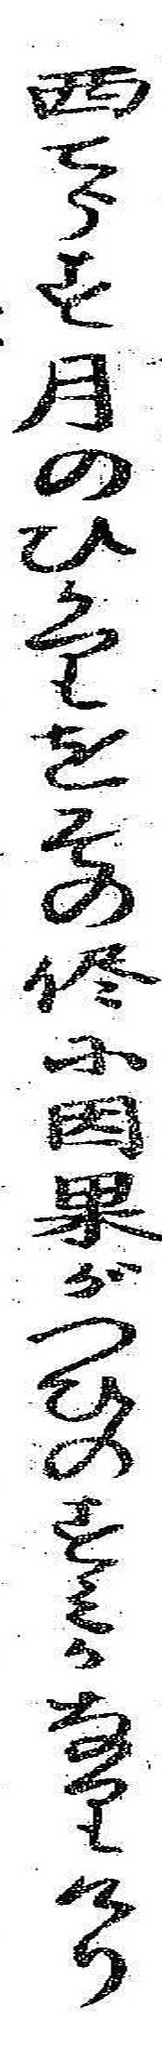西てらす月のひかりをその侭に因果がつひのすみかなりけり
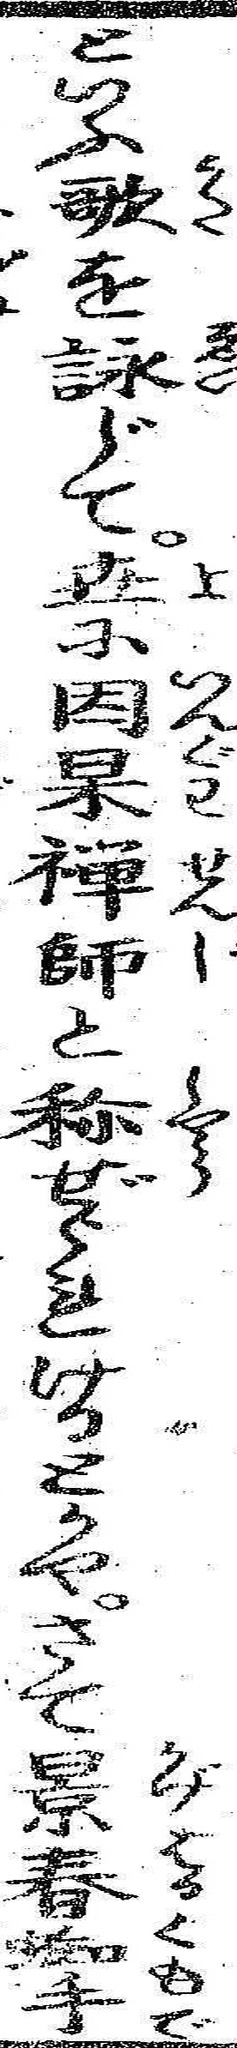といふ歌を詠じて。世に因果禅師と称ぜられけるとかや。さて景春蜘手
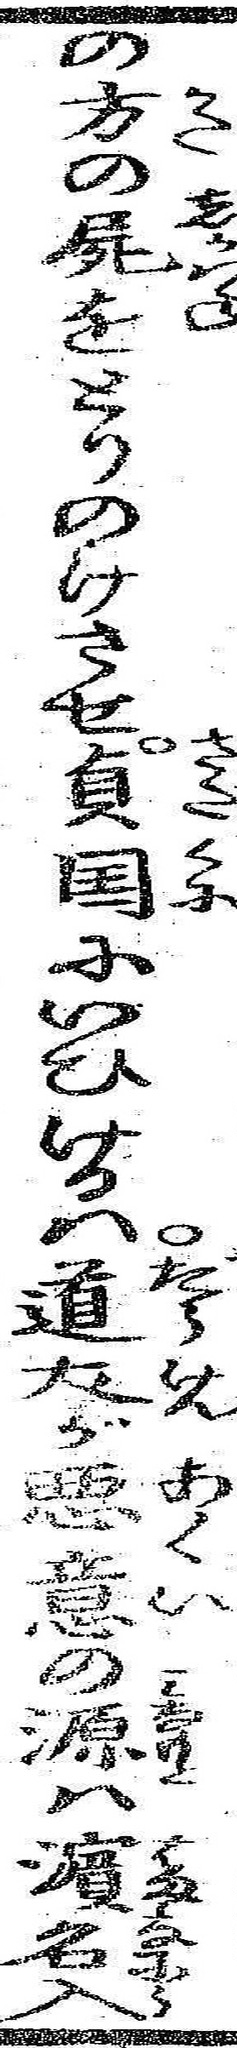の方の屍をとりのけさせ。貞国にいひけるは。道犬が悪意の源は浜名入
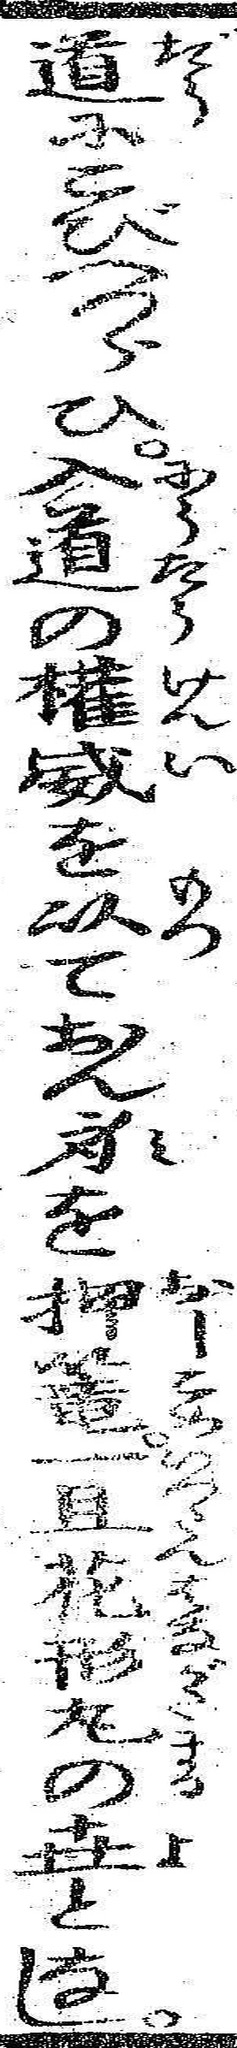道にこびへつらひ。入道の権威を以ておん身を押篭。一且花形丸の世となし。
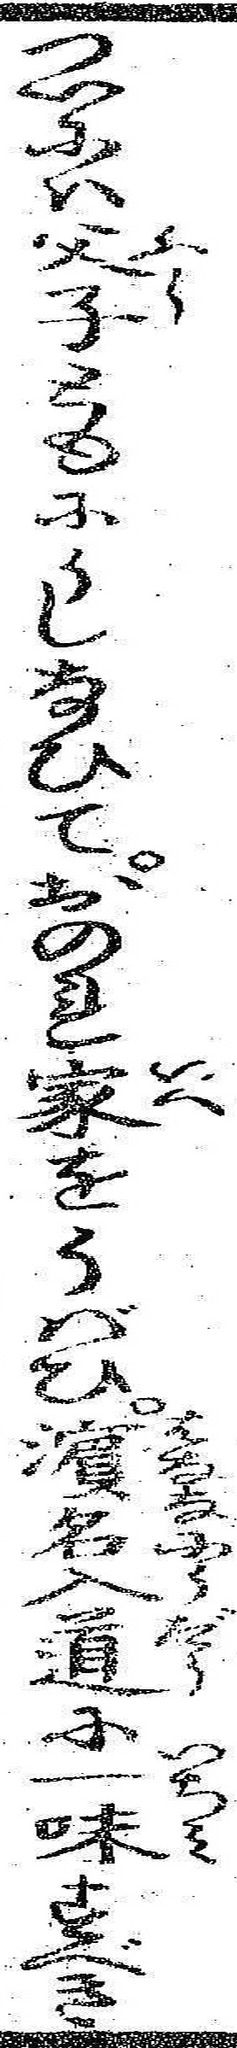ついには父子ともにうしなひて。おのれ家をうばひ。浜名入道に一味すべき
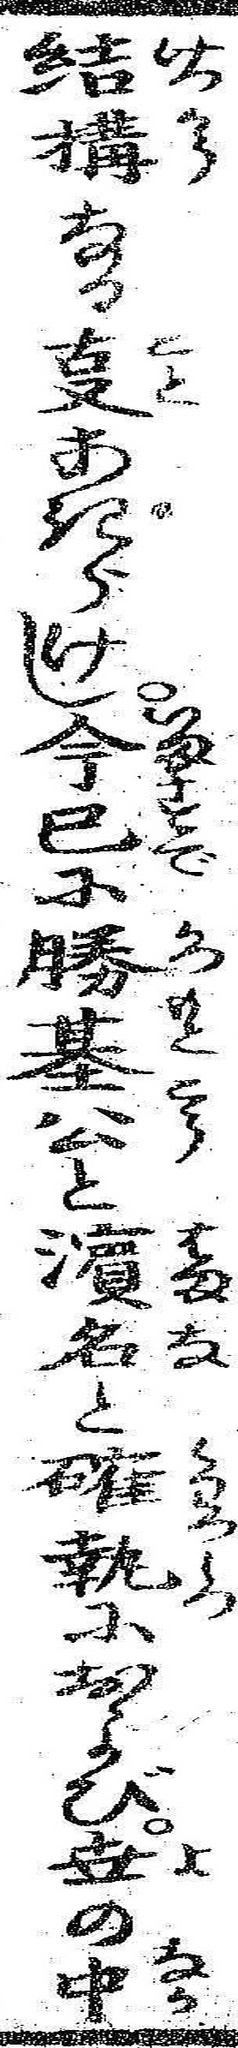結構なる事あきらけし。今已に勝基公と浜名と碓執におよび。世の中
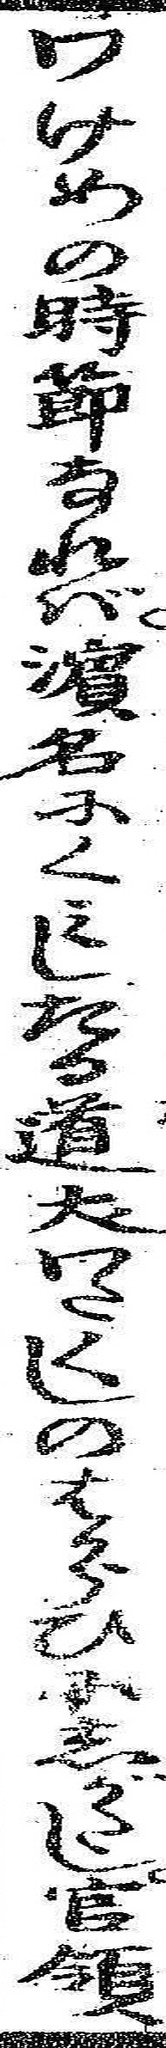わけめの時節なれば。浜名にくみしたる道犬わたくしのはからひにしがたし。官領

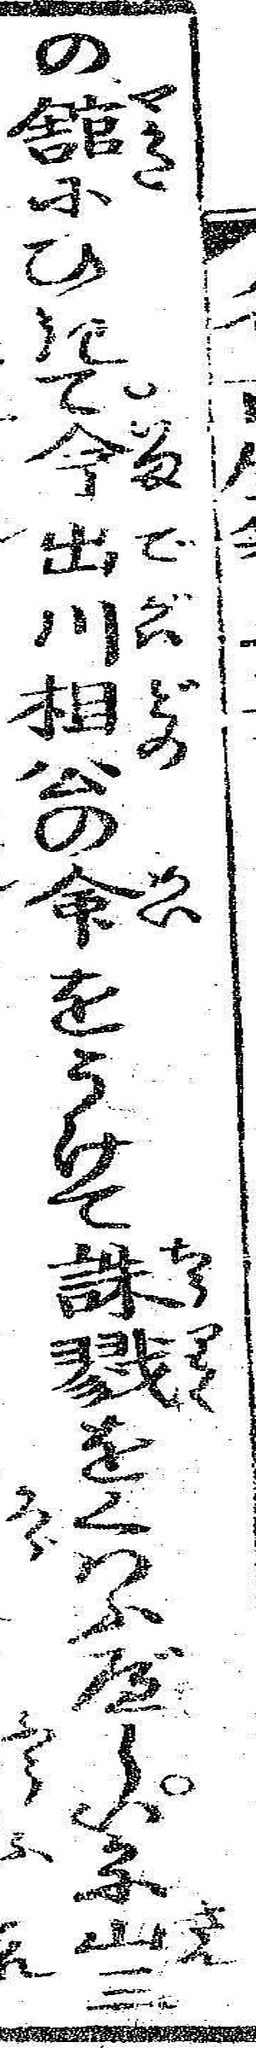の館にひきて。今出川相公の命をうけて誅戮をくはふべし。いかに山三
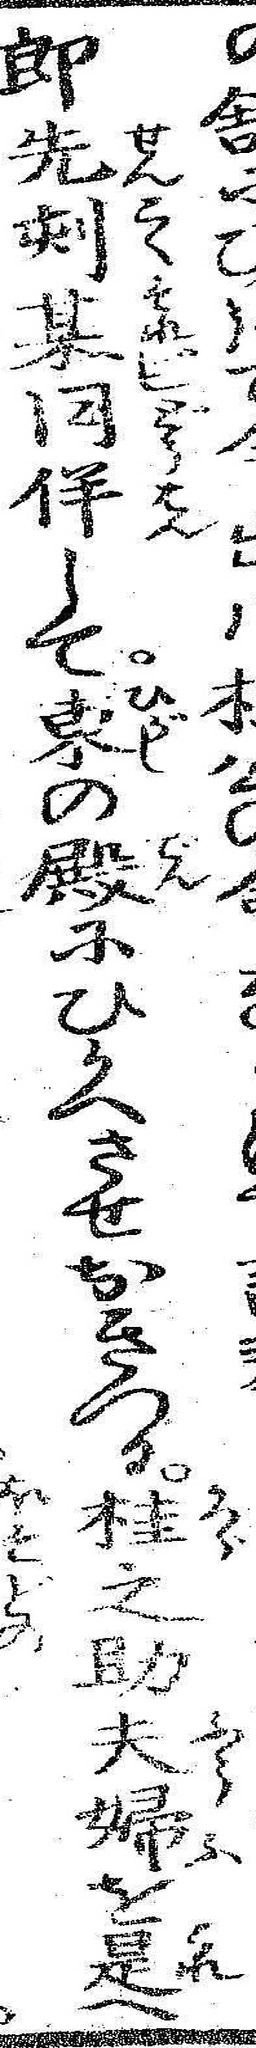郎先刻某同伴して。東の殿にひかへさせおきつる。桂之助夫婦を是へ
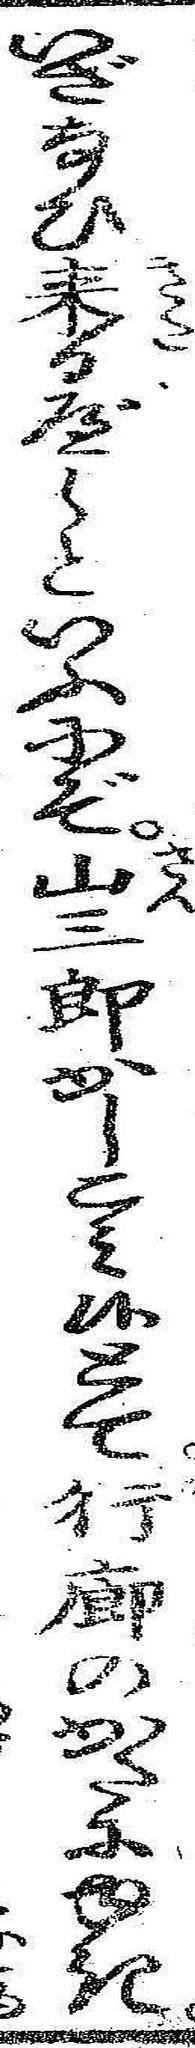いざなひ来るべしといふにぞ。山三郎かしこみ候とて。行廊のかたにゆき。
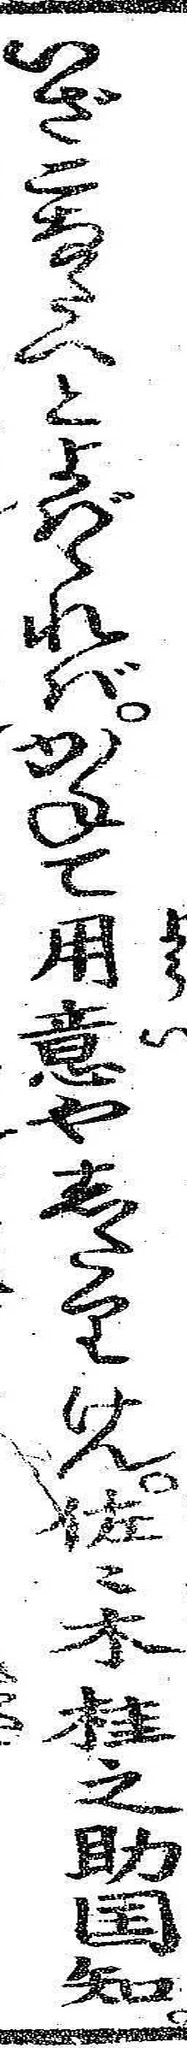いざこなたへとよばゝれば。かねて用意やしたりけん。佐々木桂之助国知。
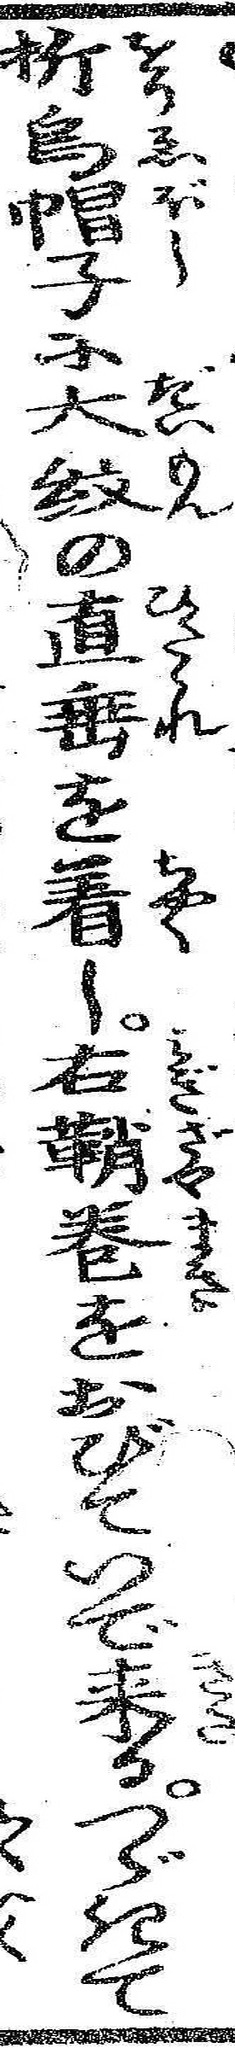折烏帽子に大紋の直垂を着し。右鞘巻をおびていで来る。つゞきて
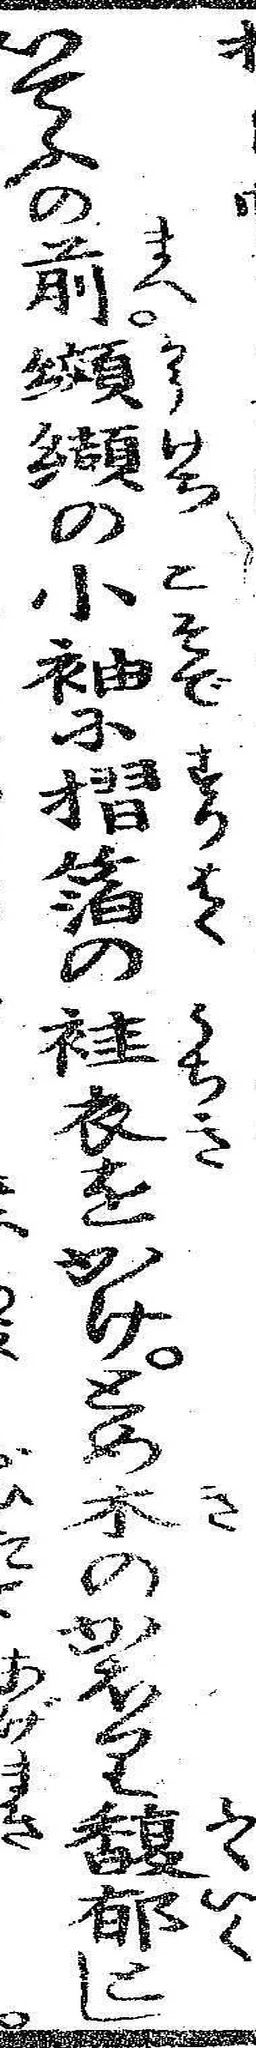いてふの前。纐纈の小袖に摺箔の袿衣をかけ。とめ木のかほり馥郁とし
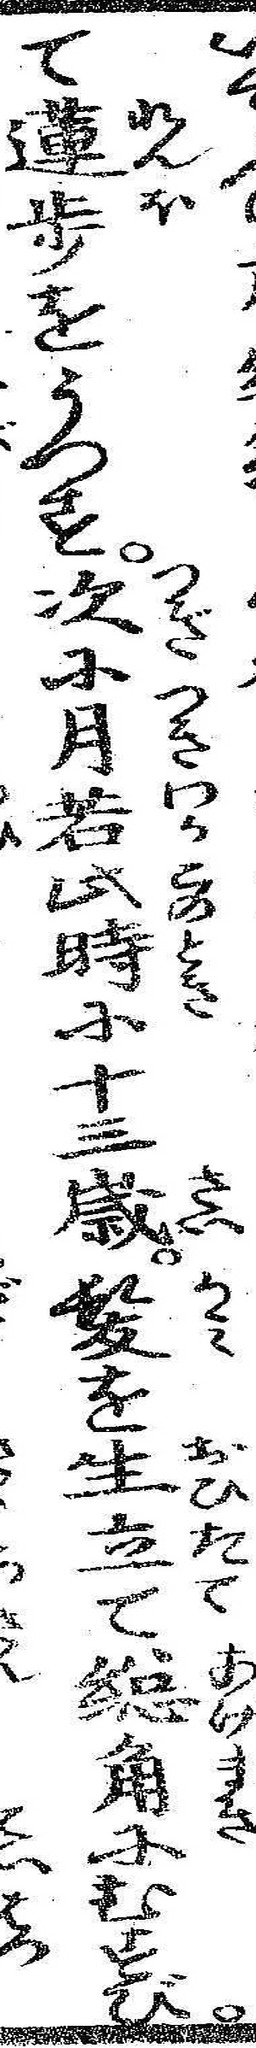て蓮歩をうつす。次に月若此時に十三歳。髪を生立て総角にむすび。
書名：昔話稲妻表紙
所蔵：国文学研究資料館
